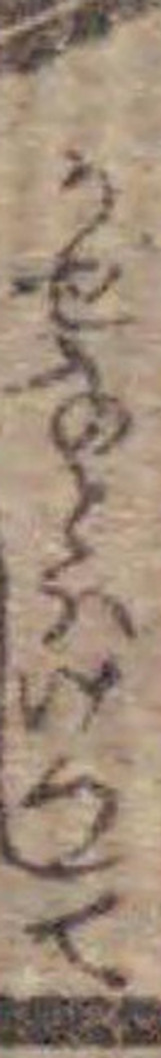かせなとはけつして
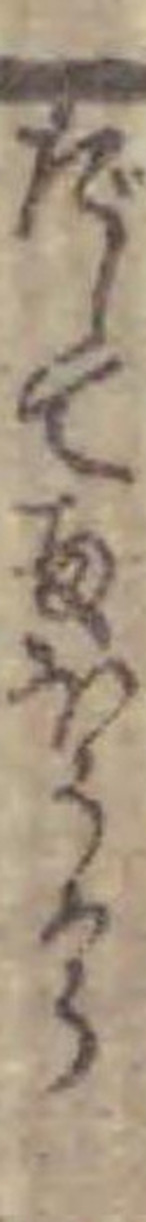だして両ほうから
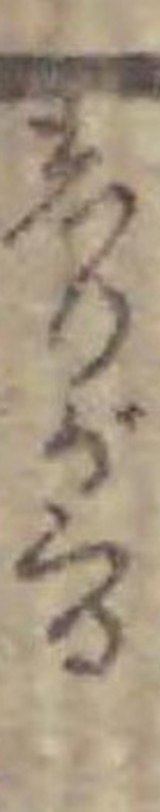しりがくる
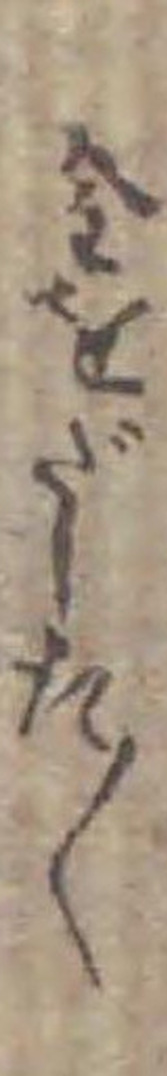金をだした〳〵
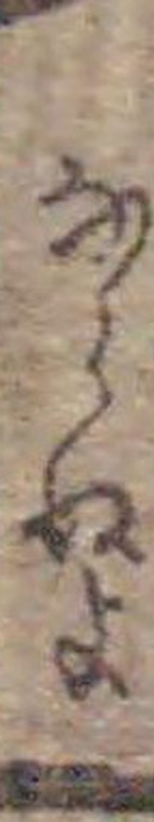ならぬよ
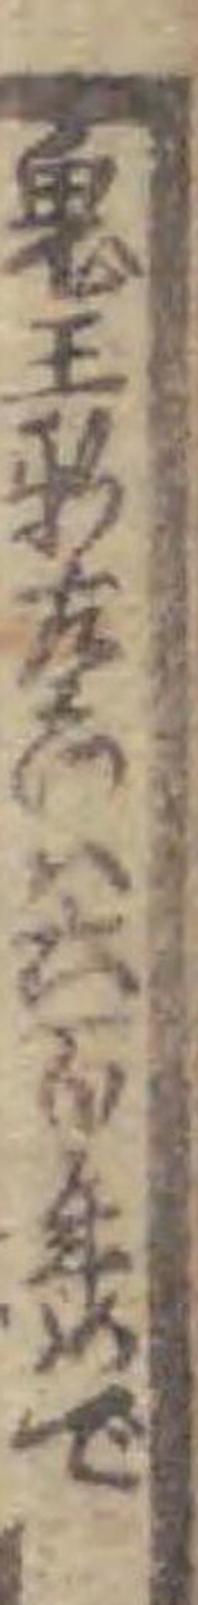鬼王新左衛門は六白年めで
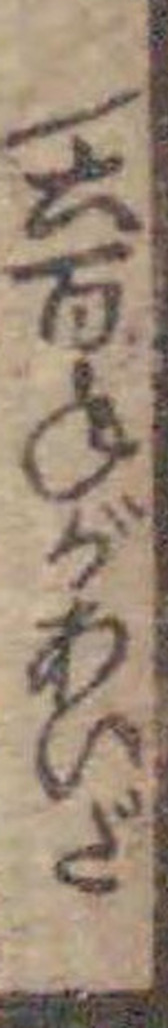六百年があいだ
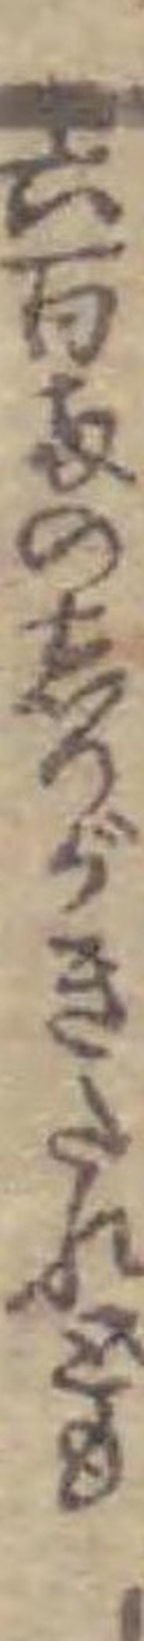六百両のしりがきたれども
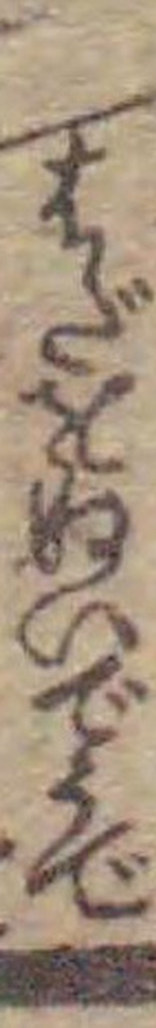はだをぬいでうで
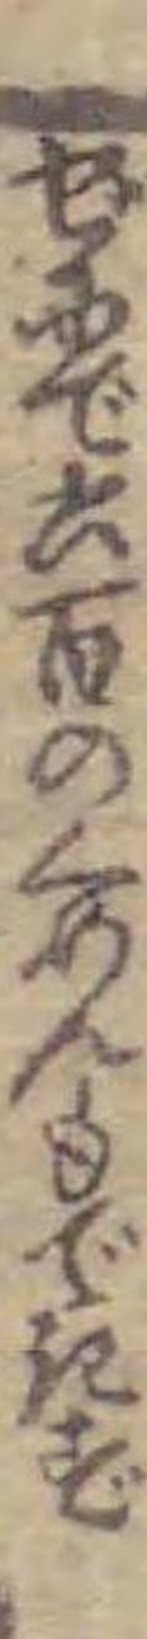ぜにで六百のくめんもできず
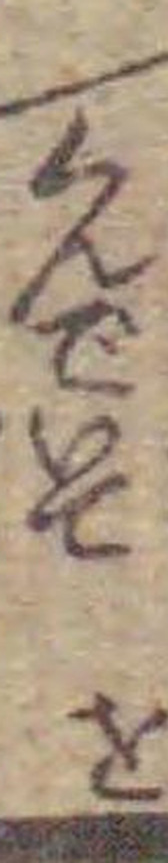くんでいて
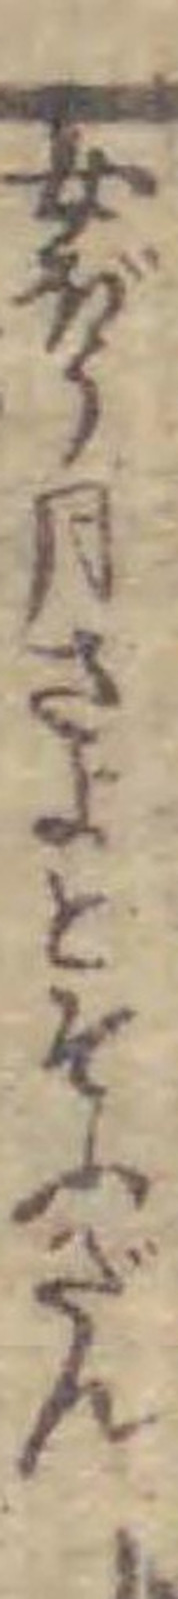女ぼう月さよとそふだん
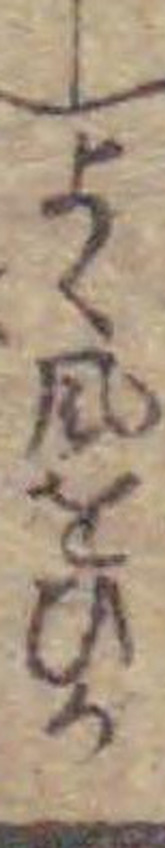よく風をひか
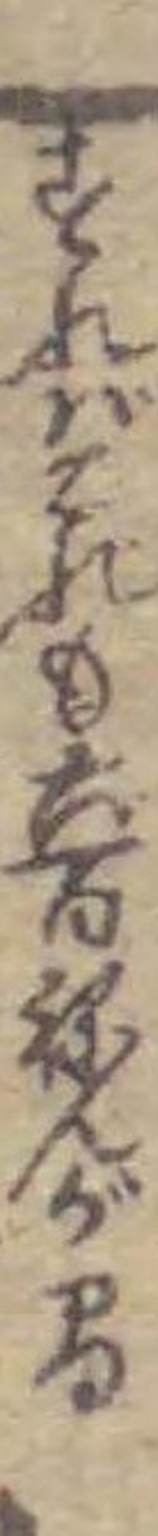すればこれも六百ねんが間
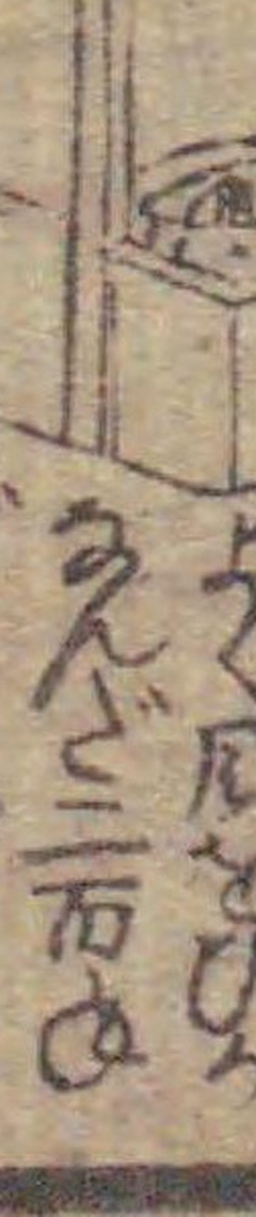なんだ二百年
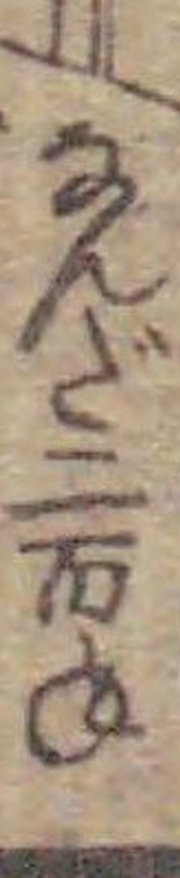なんだ二百年
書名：年寄之冷水曽我 : 3巻
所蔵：国立国会図書館 National Diet Library, JAPAN
